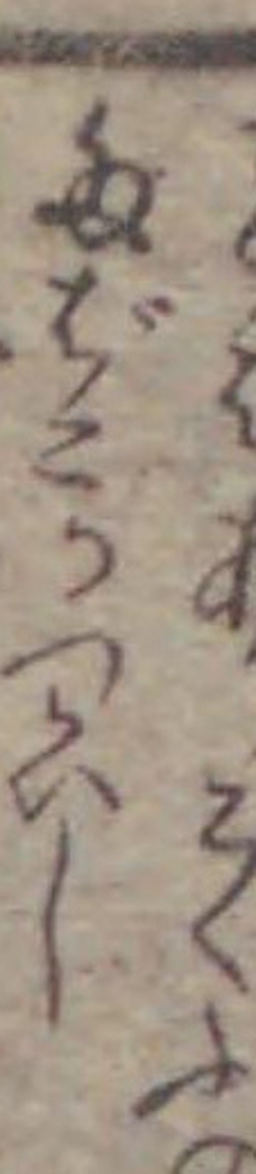たばこかつかいし
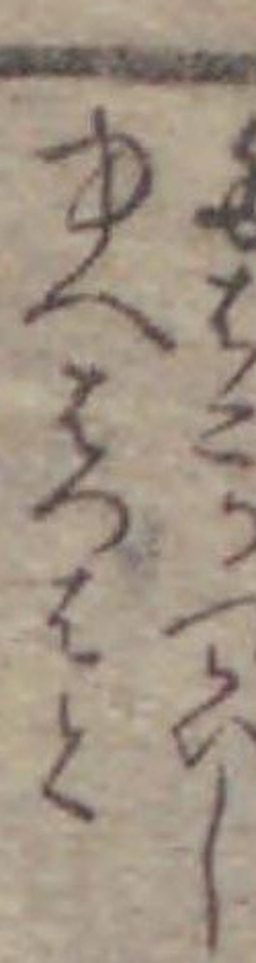ゆへはつはと
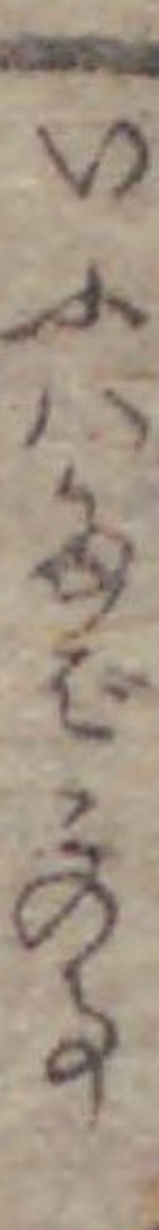いふはたばこの事
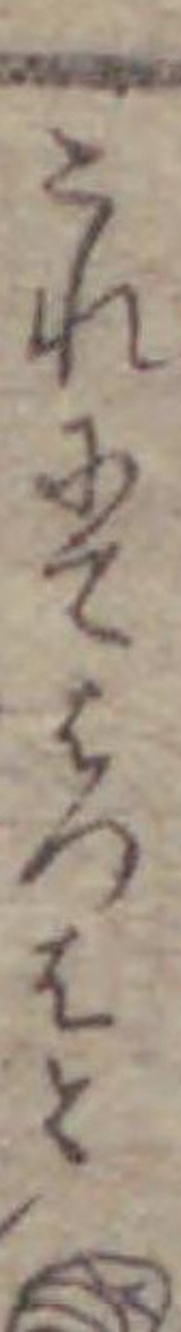これにてはつはと
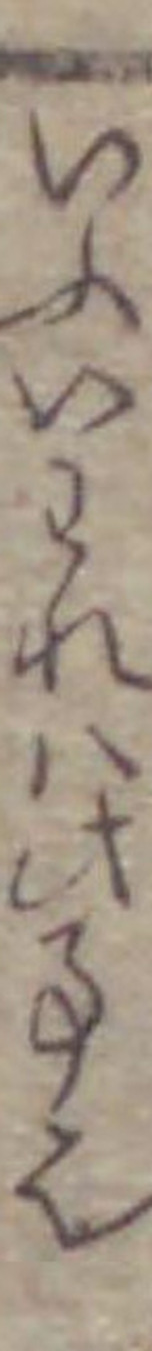いふいわれは此事也
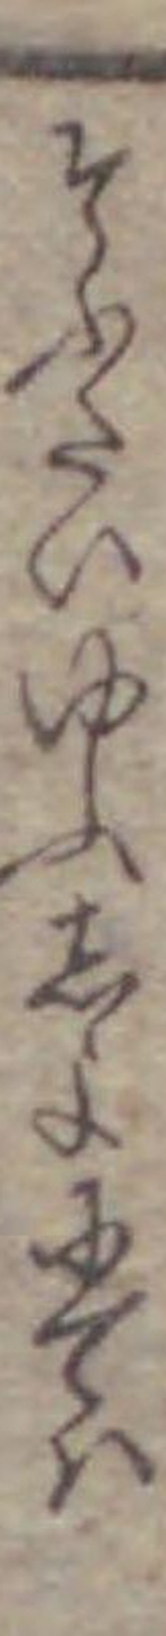そふたいゆふしよにては
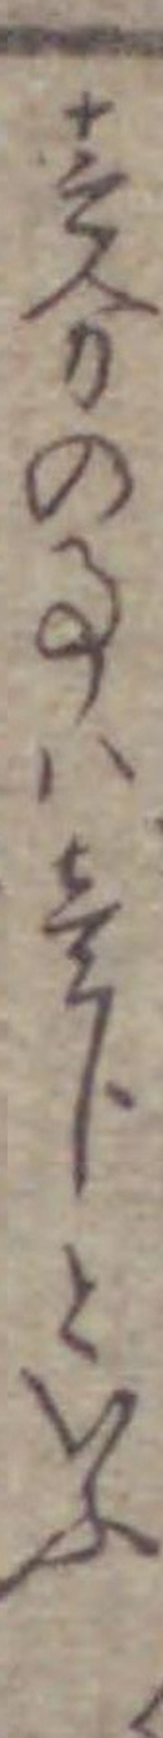壱分の事は壱分といふ
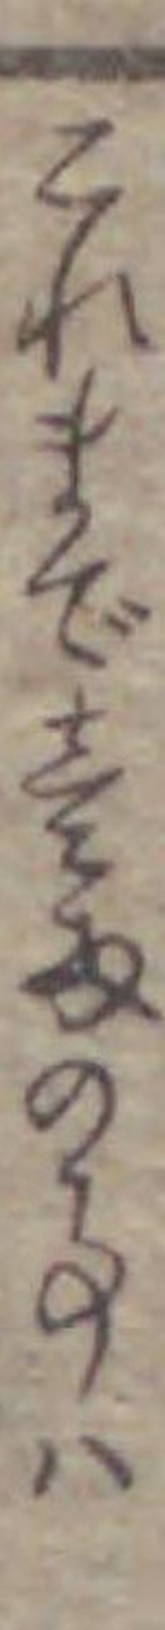これまで壱両の事は
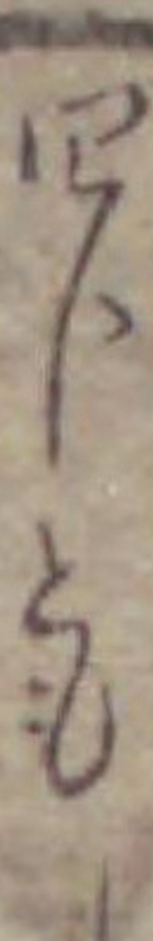四分とも
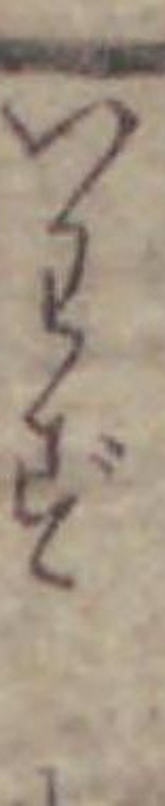いわず
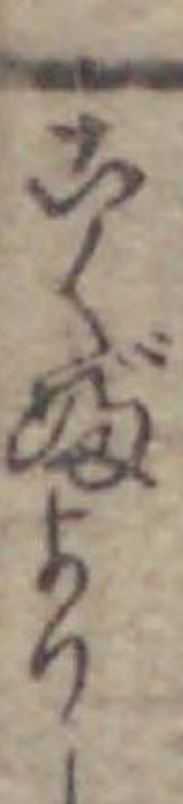こくぶより
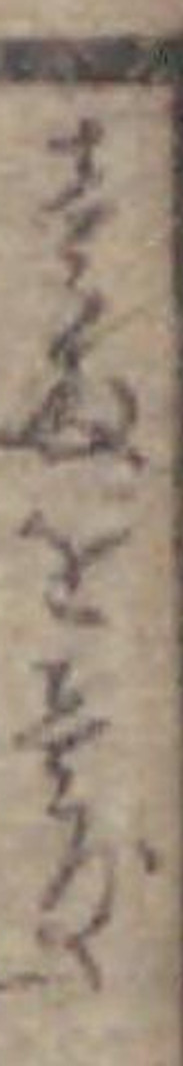壱両を壱歩
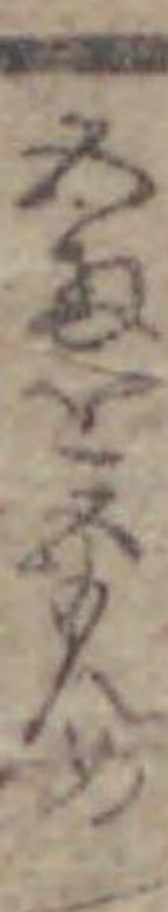五両を五もんめ
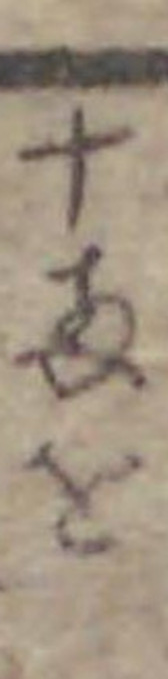十両を
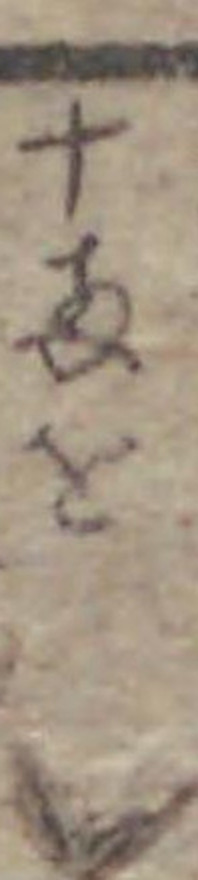十両を
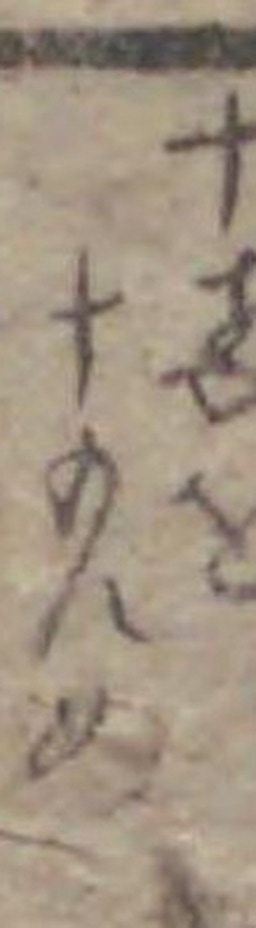十もんめ
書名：談芭菰誉詞 : 3巻
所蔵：国立国会図書館 National Diet Library, JAPAN
